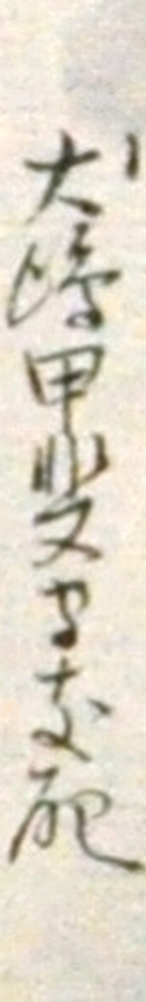大島甲斐守支配
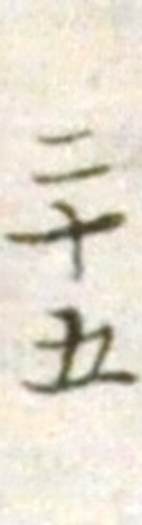二十五
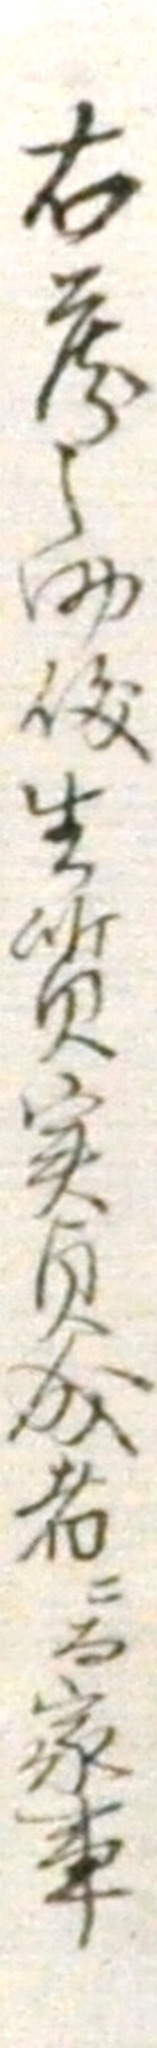右蔵之助儀生質実貞成者にて家事
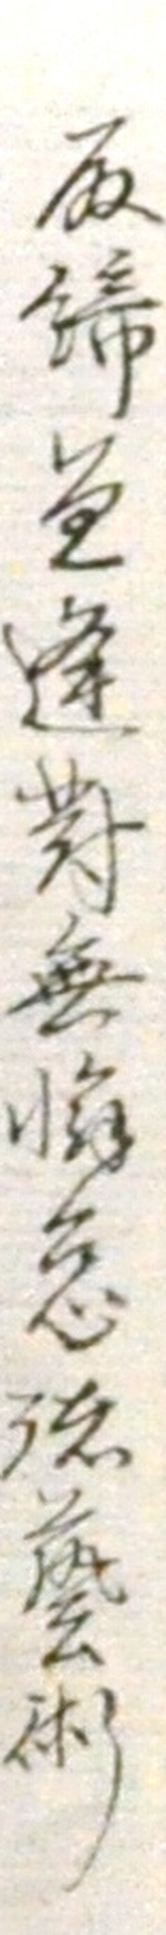取締宜逢対無懈怠諸芸術
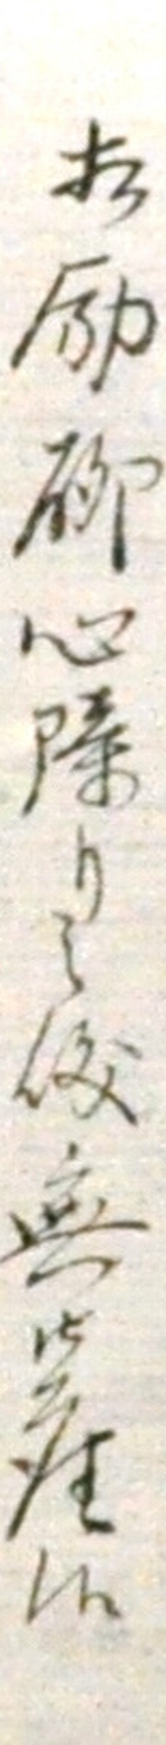相励聊心障り之儀無御座候
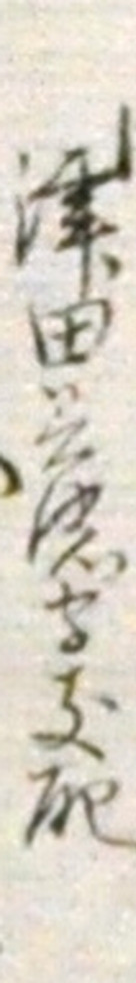津田美濃守支配
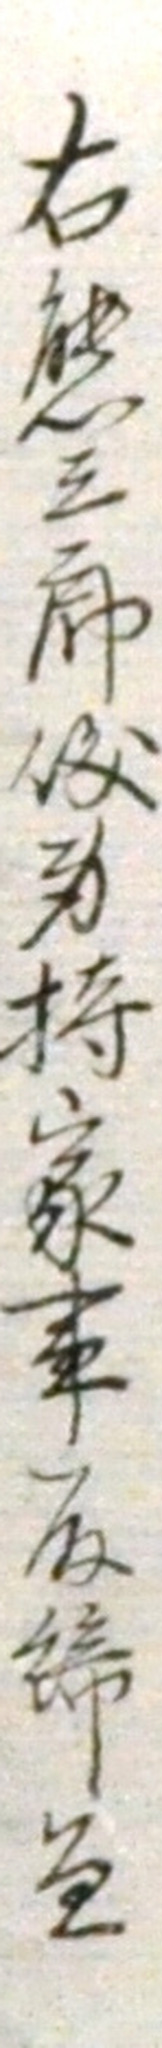右熊三郎儀身持家事取締宜
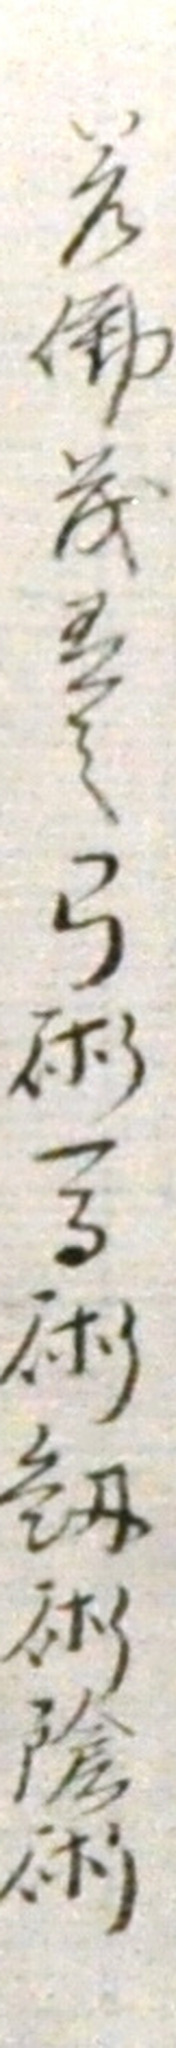差働も有之弓術馬術剣術鎗術
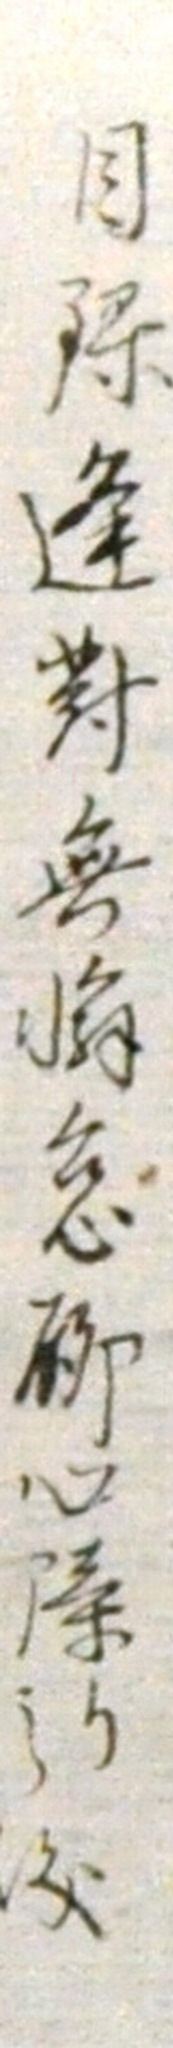目録逢対無懈怠聊心障り之儀
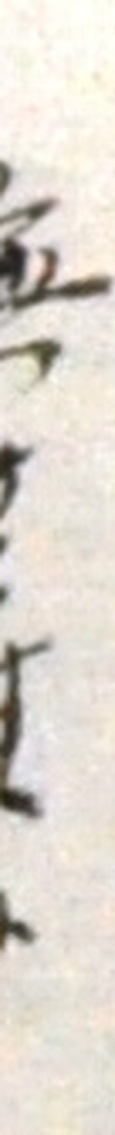無御座候

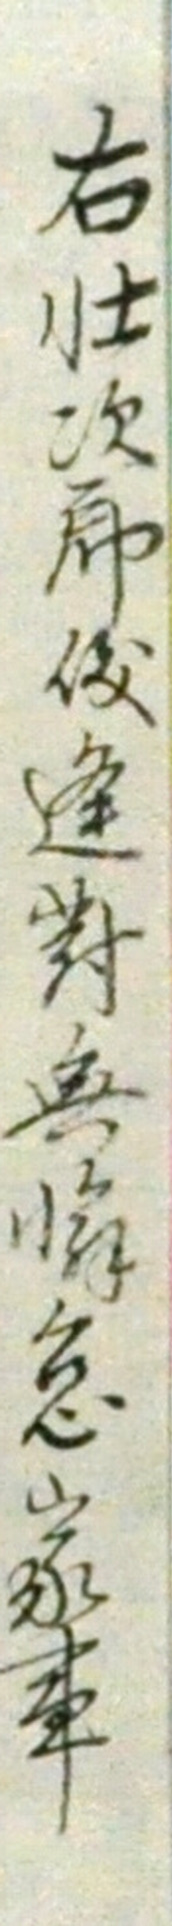右壮次郎儀逢対無懈怠家事
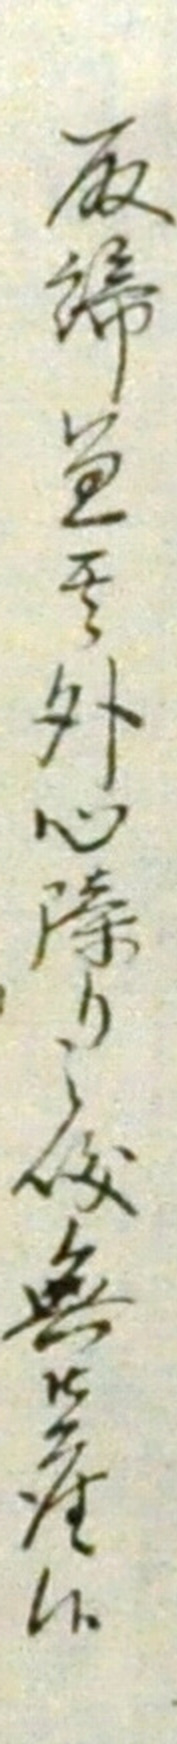取締宜其外心障り之儀無御座候
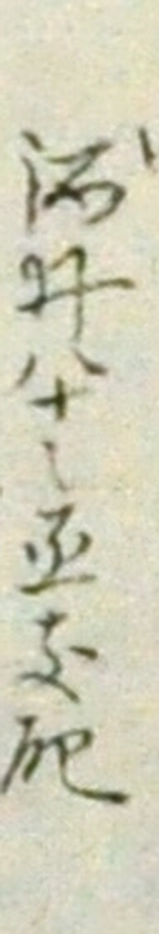酒井八十之丞支配
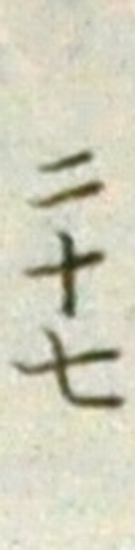二十七
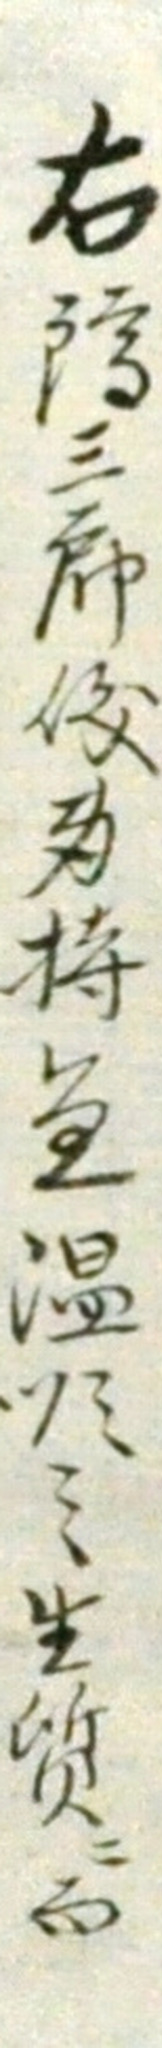右鎬三郎儀身持宜温順之生質にて
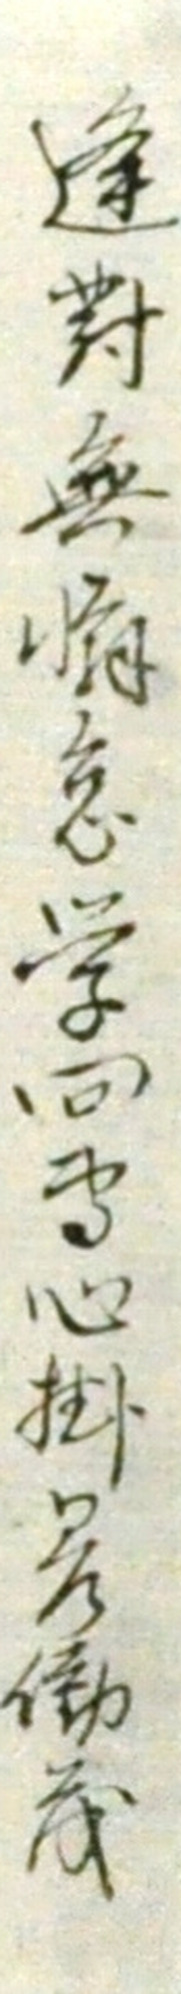逢対無懈怠学問専心掛差働も
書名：右大将様御書院番御入人調
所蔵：伊那市立高遠町図書館・合同会社AMANE
